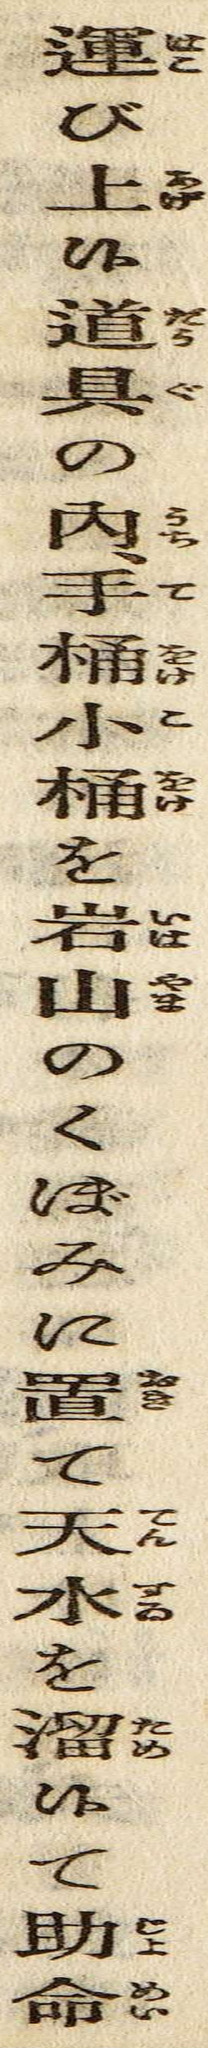運び上候道具の内、手桶小桶を岩山のくぼみに置て天水を溜候て助命

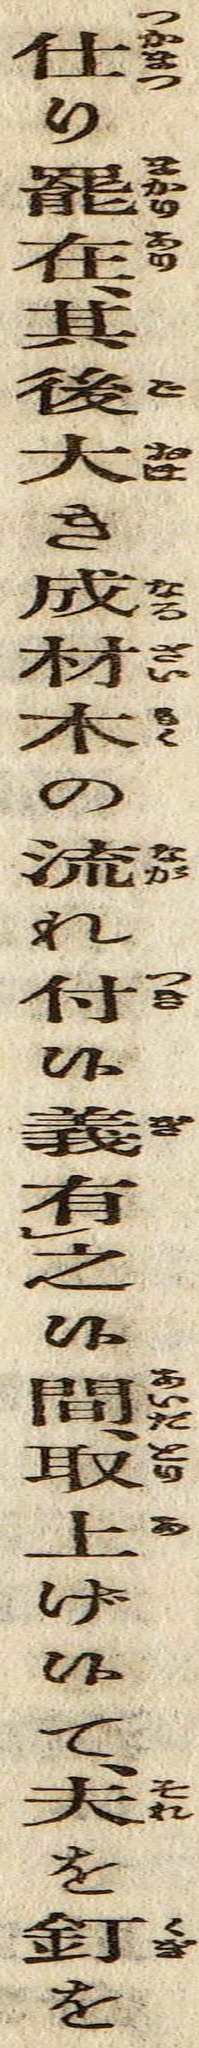仕り罷在、其後大き成材木の流れ付候義有之候間、取上げ候て、夫を釘を
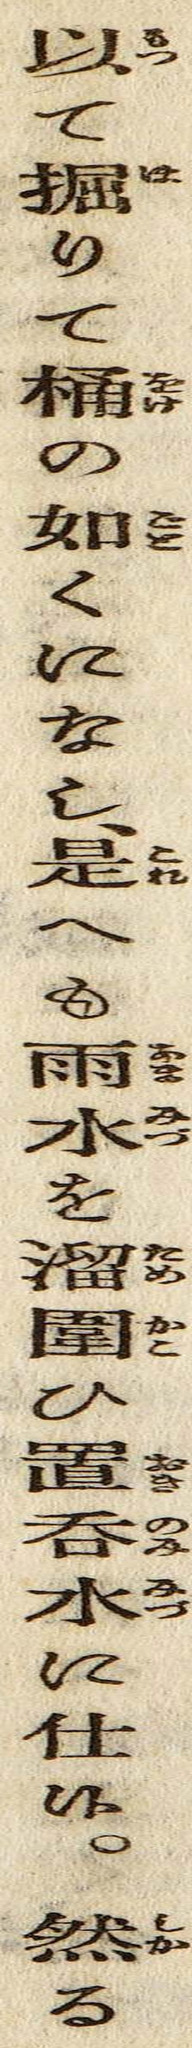以て掘りて桶の如くになし、是へも雨水を溜囲ひ置呑水に仕候。然る
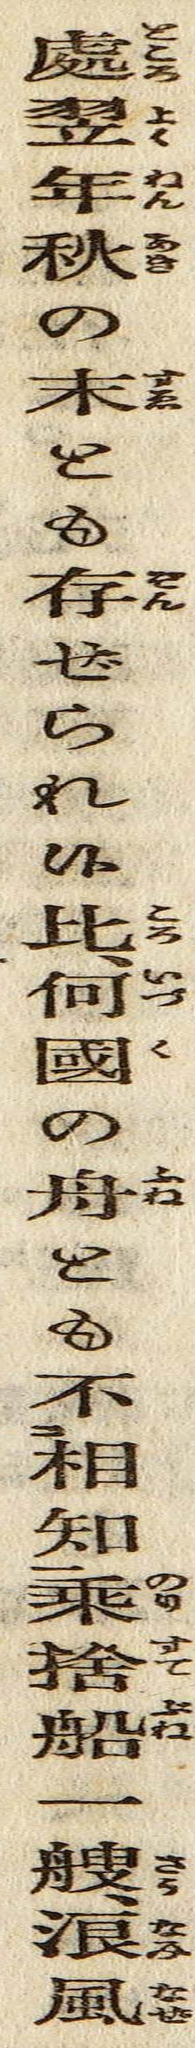処翌年秋の末とも存ぜられ候比、何国の舟とも不相知乗捨船一艘、浪風
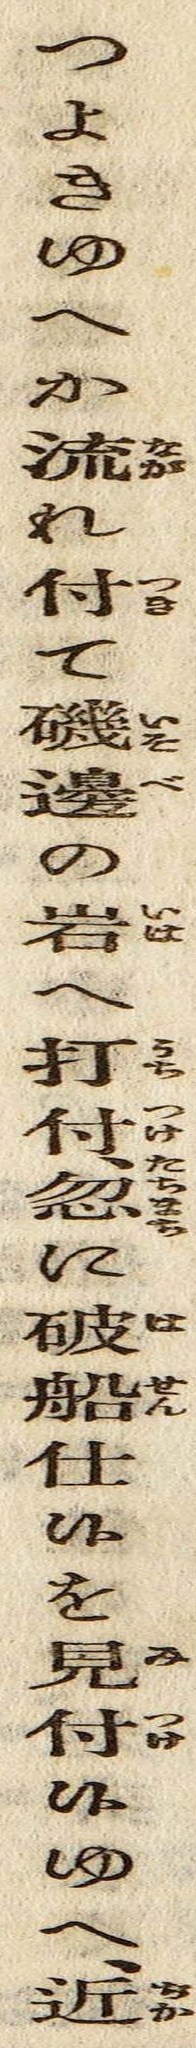つよきゆへか流れ付て磯辺の岩へ打付、忽に破船仕候を見付候ゆへ、近
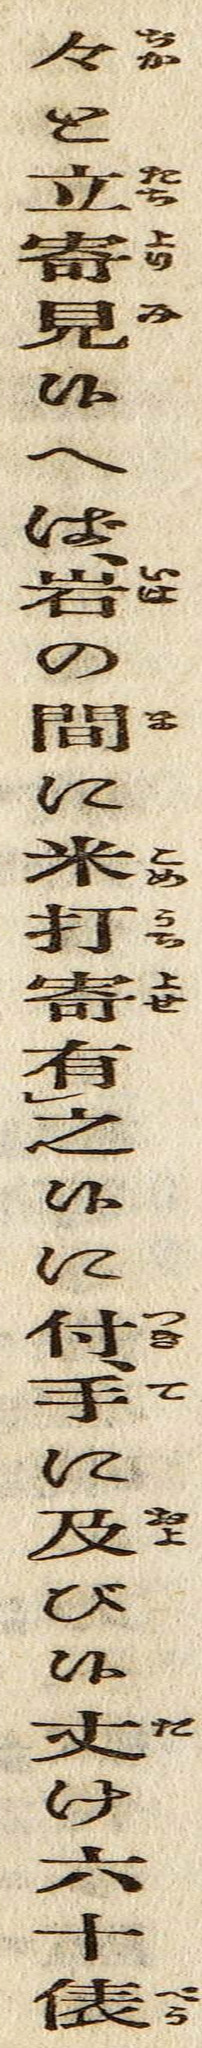々と立寄見候へば、岩の間に米打寄有之候に付、手に及び候丈け六十俵
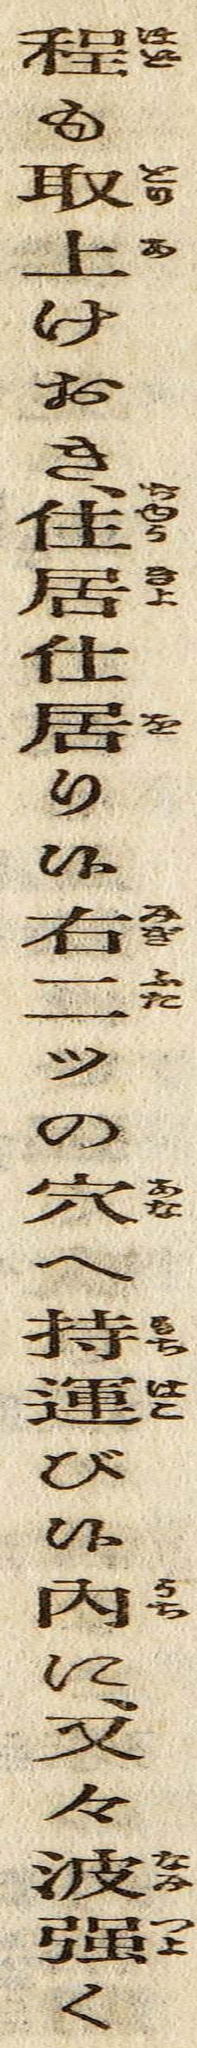程も取上けおき、住居仕居り候右二ツの穴へ持運び候内に、又々波強く
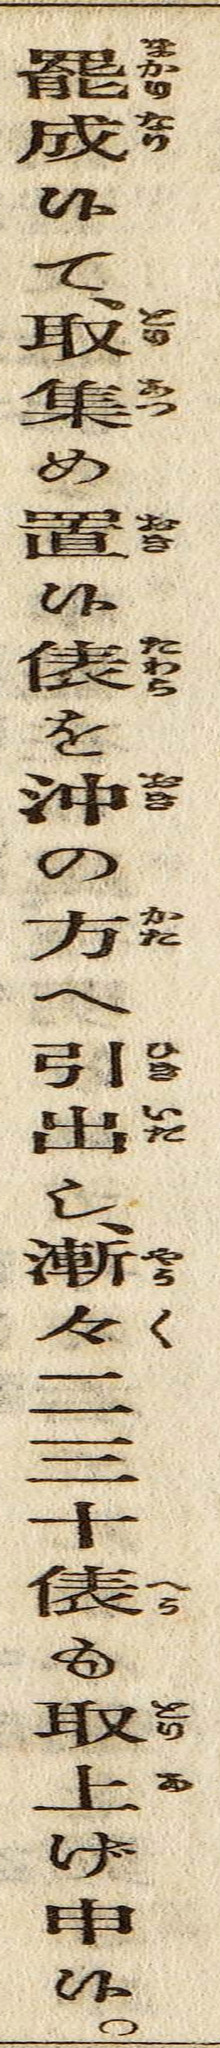罷成候て、取集め置候俵を沖の方へ引出し、漸々二三十俵も取上げ申候。
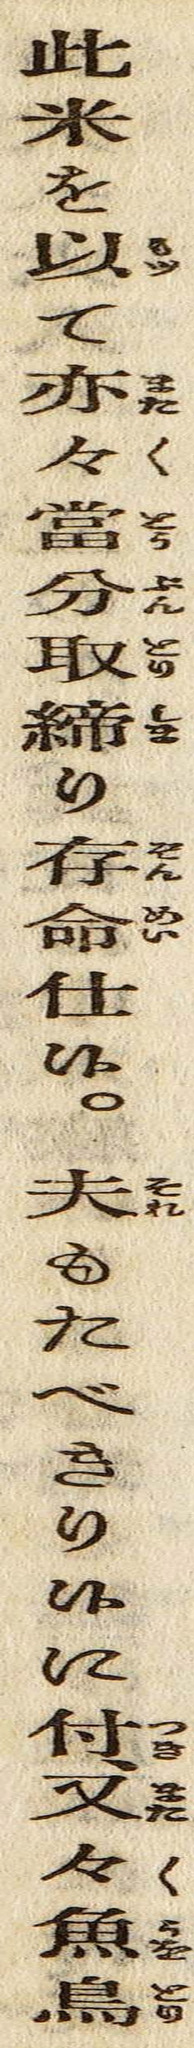此米を以て亦々当分取締り存命仕候。夫もたべきり候に付、又々魚鳥
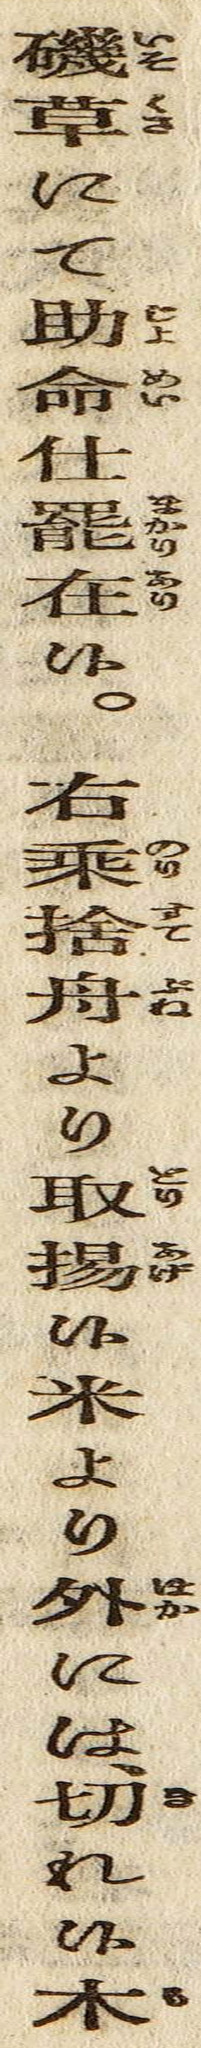磯草にて助命仕罷在候。右乗捨舟より取揚候米より外には、切れ候木
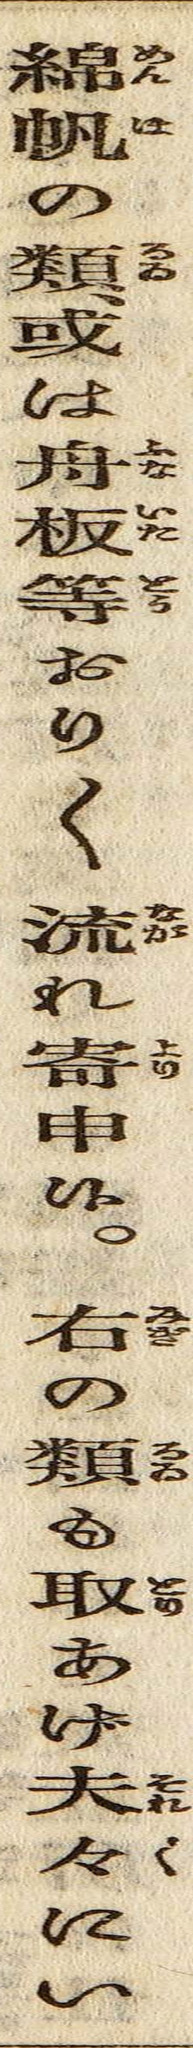綿帆の類、或は舟板等おり〳〵流れ寄申候。右の類も取あげ夫々にい
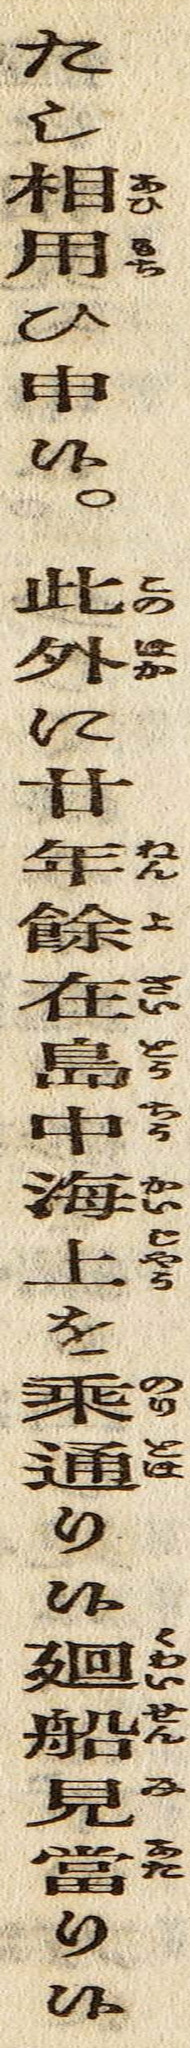たし相用ひ申候。此外に廿年余在島中海上を乗通り候廻船見当り候
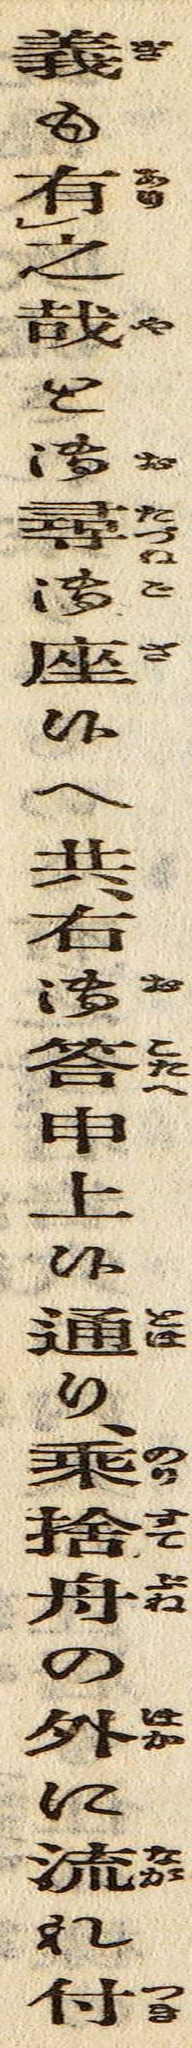義も有之哉と御尋御座候へ共、右御答申上候通り、乗捨舟の外に流れ付
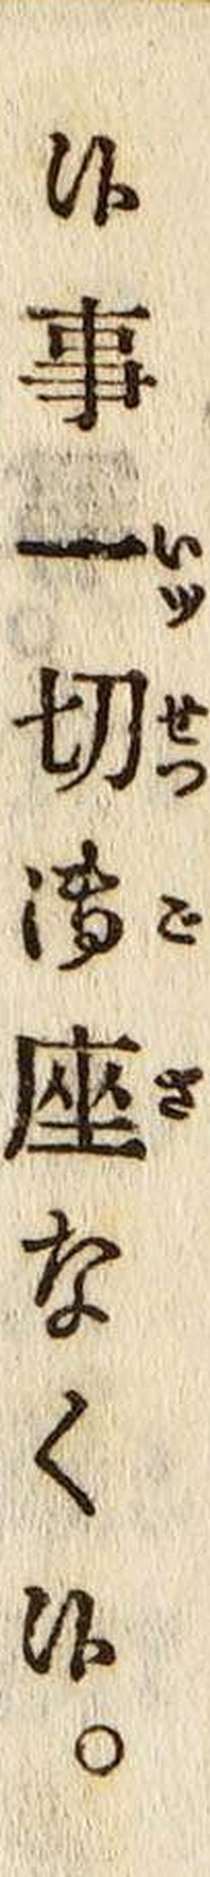候事一切御座なく候。
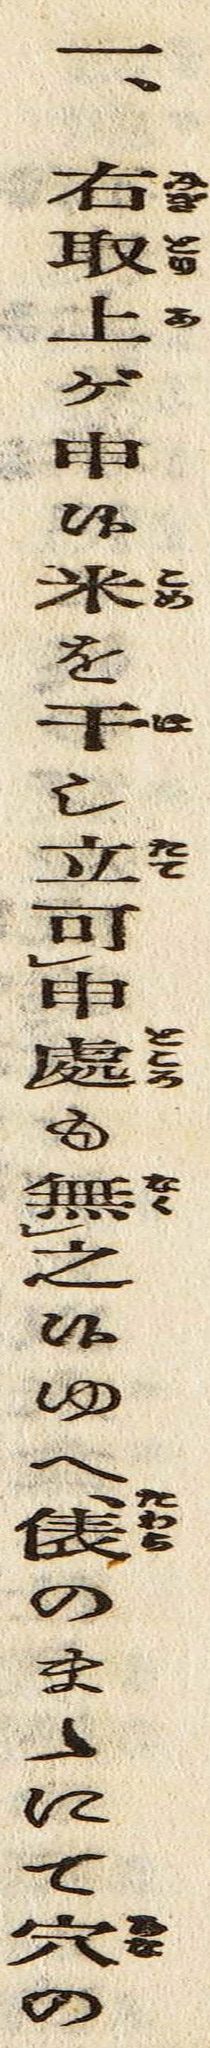一、右取上ゲ申候米を干し立可申処も無之候ゆへ、俵のまゝにて穴の
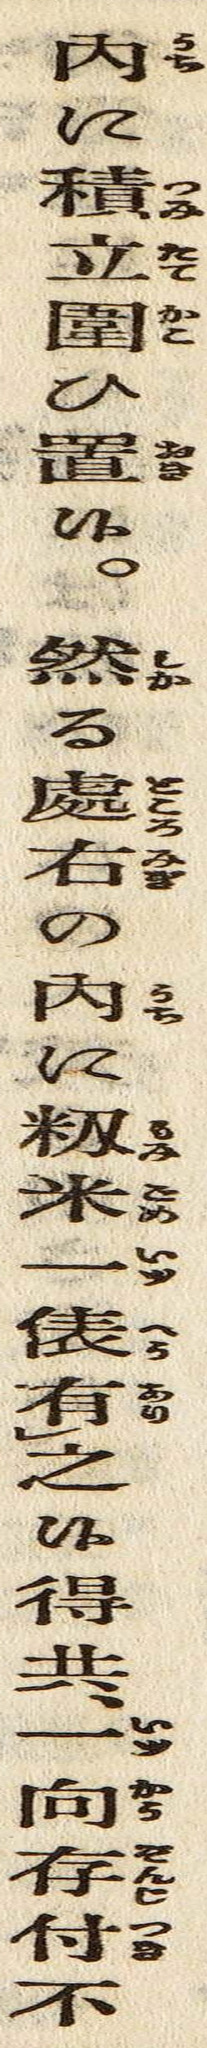内に積立囲ひ置候。然る処右の内に籾米一俵有之候得共、一向存付不
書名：日本漂流譚
